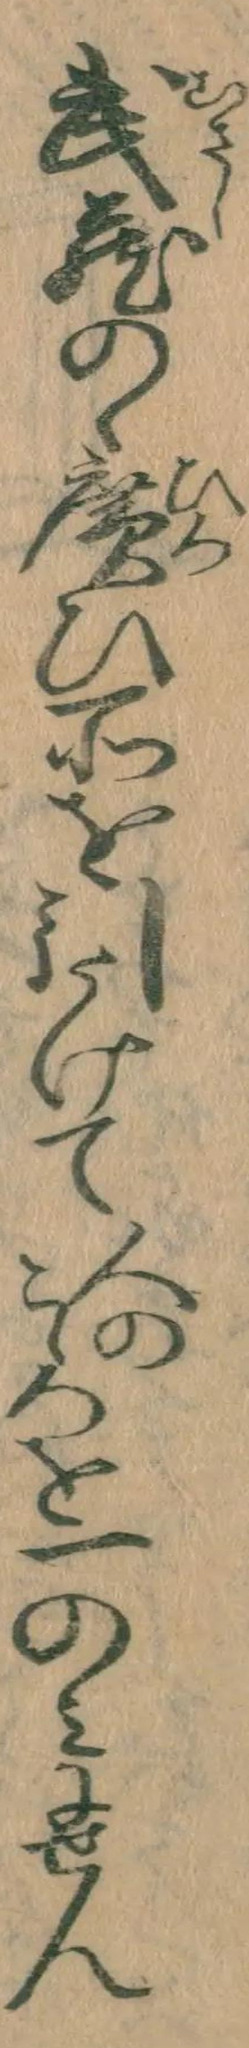武蔵のゝ広ひ所を引うけて人のこゝろを一のみにせん
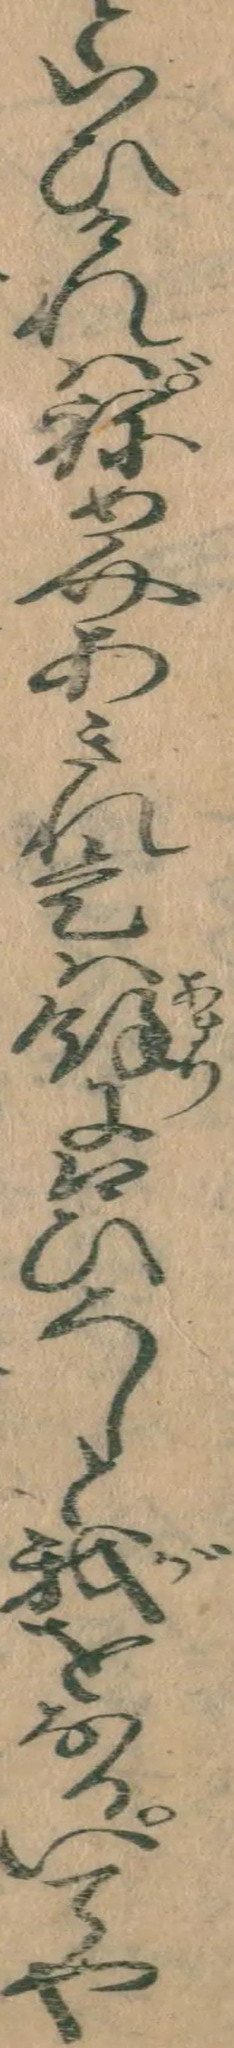といひければ。ねめ介あきれ是は余に口ひろしと我をおる。いてや
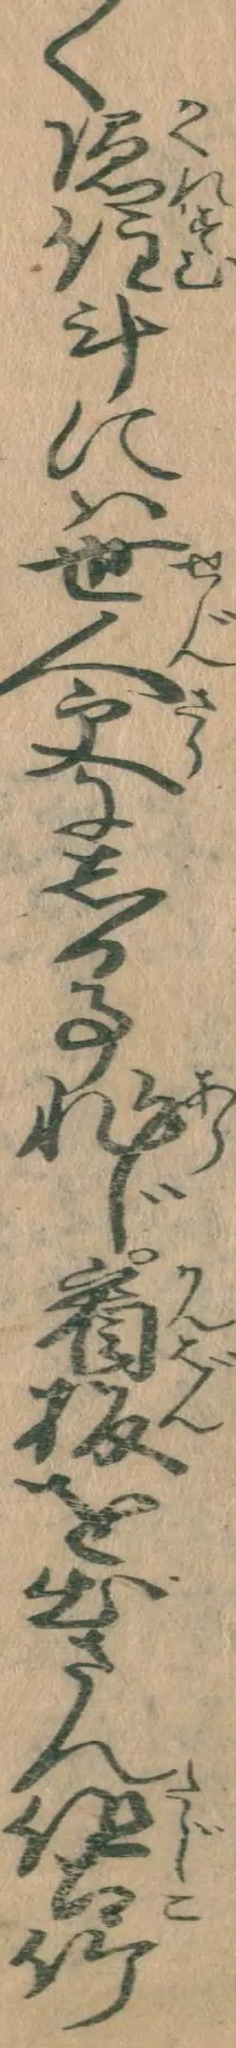かく隠住計には世人更にしる事非じ。看板を出さん但故竹
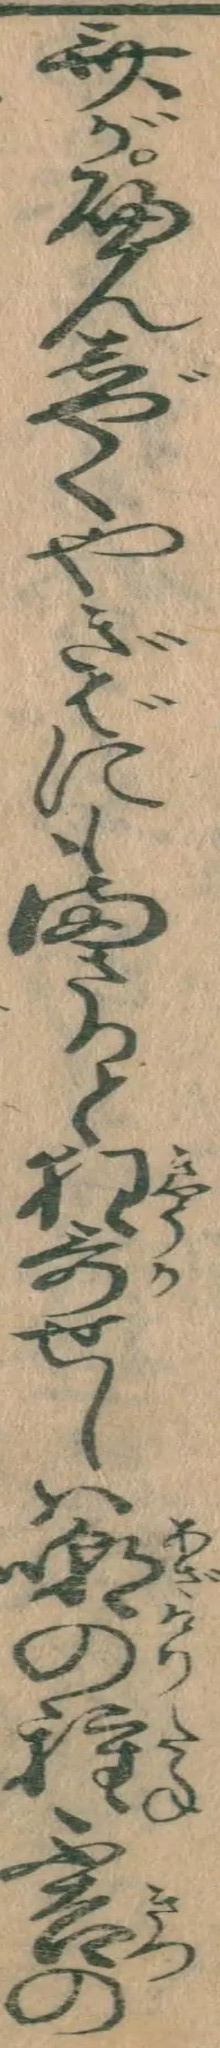斎が。へんじやくやぎばにもまさると狂歌せしは嘲の種不吉の
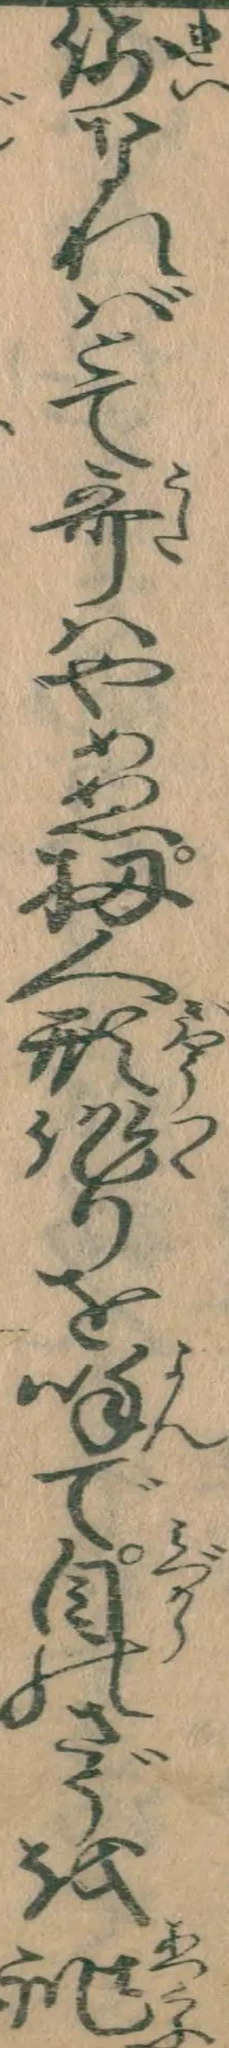例なればとて歌はやめぬ。扨人形作りを呼で。自のざうを誂
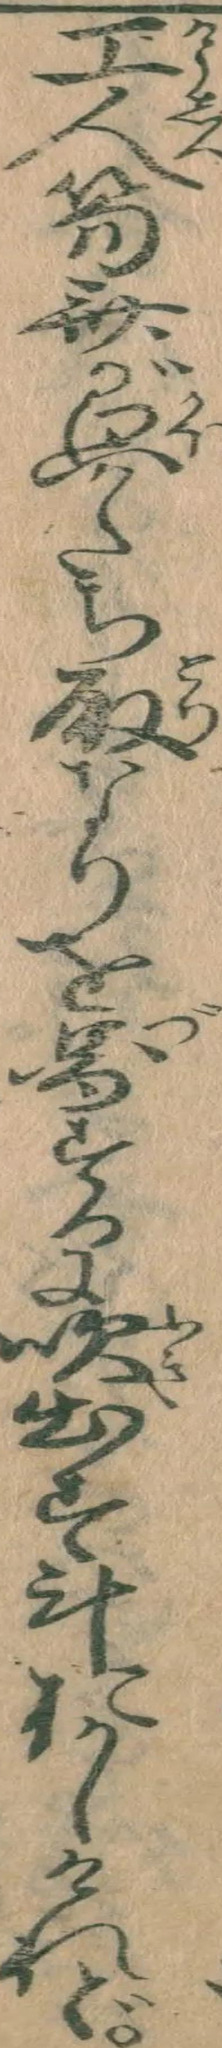工人筍斎が貌かたち取なりを図するに吹出す計おかしけれど。
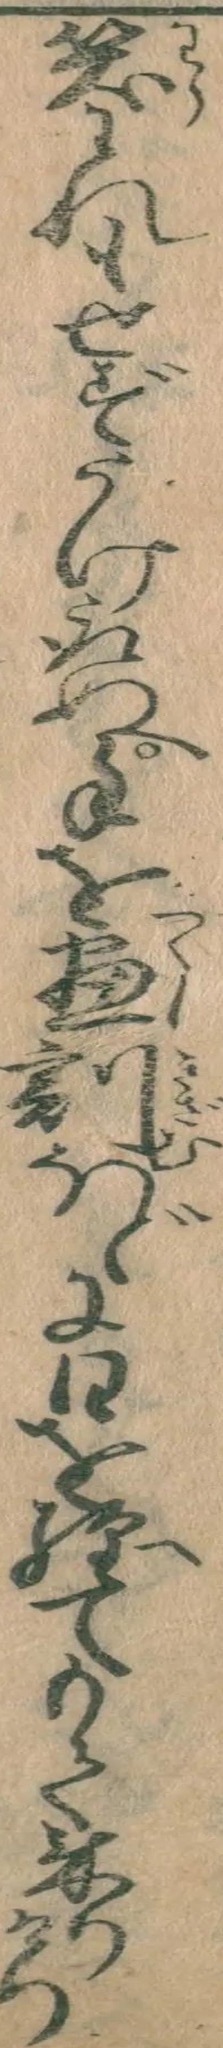笑われもせずうけ取ぬ。手を尽刻ほどに日を経てもて来りけり
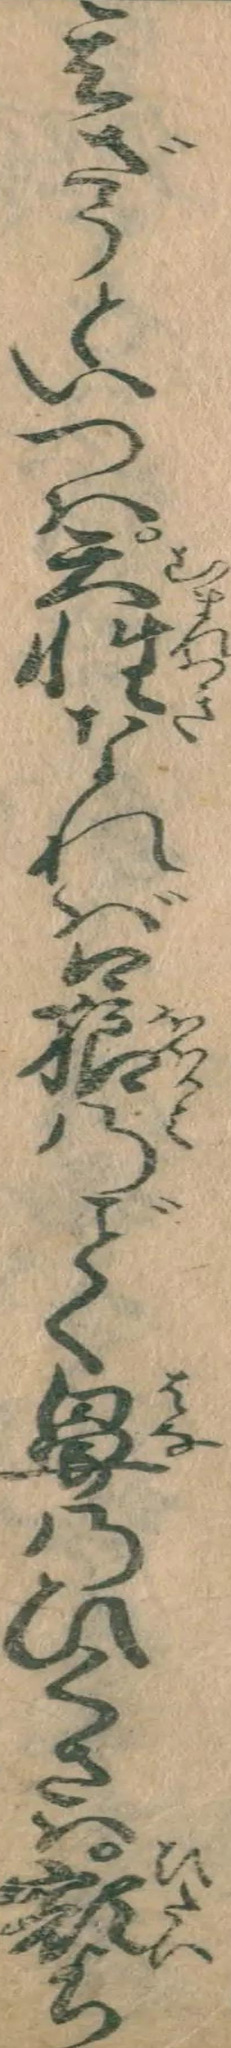其ざうといつは。天性なれば口狼のごとく鼻のひくさは。額より
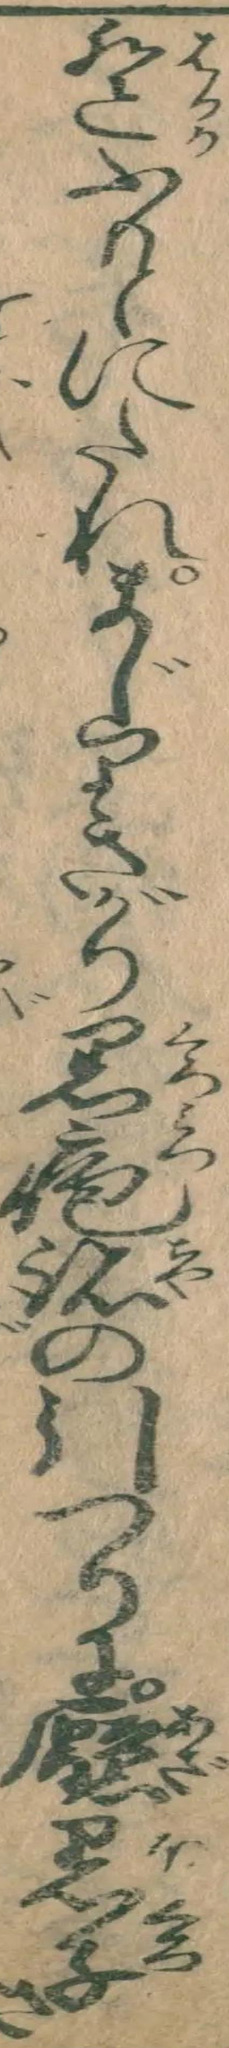遥ふもとにたれ。まじりさがり黒庖跡の引つりに。痣黒子さ
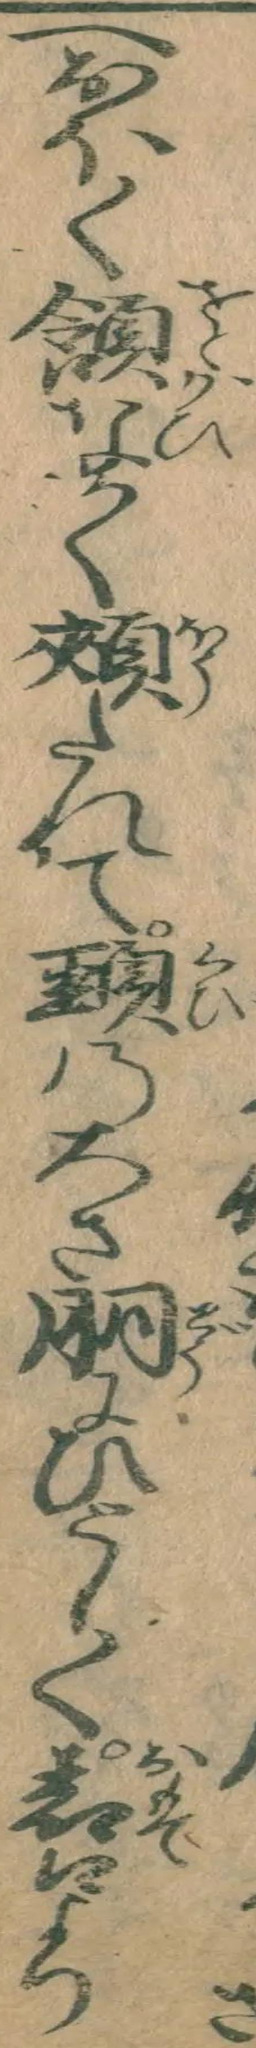へおほく頷なかく頬たれて。頸の大さ胴にひとしく。表口より

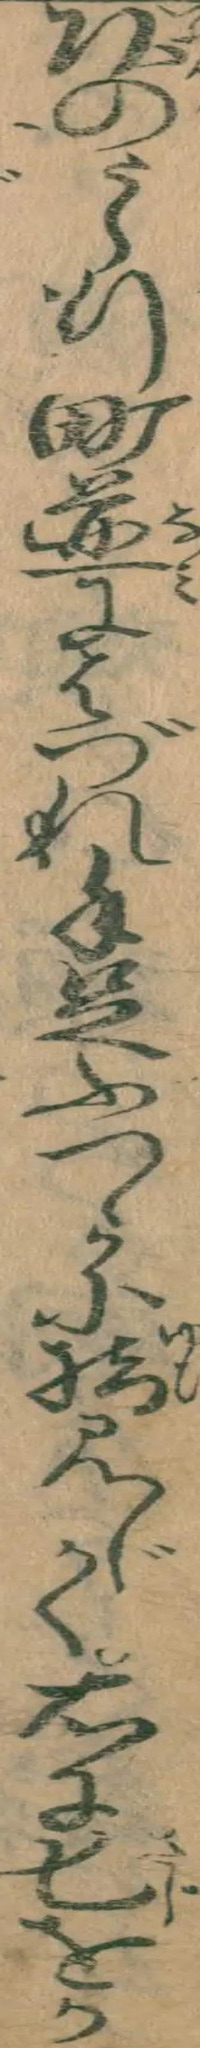頭のうら行町並にはづれ手足ふつゝかに指みじかく。右に匕をか
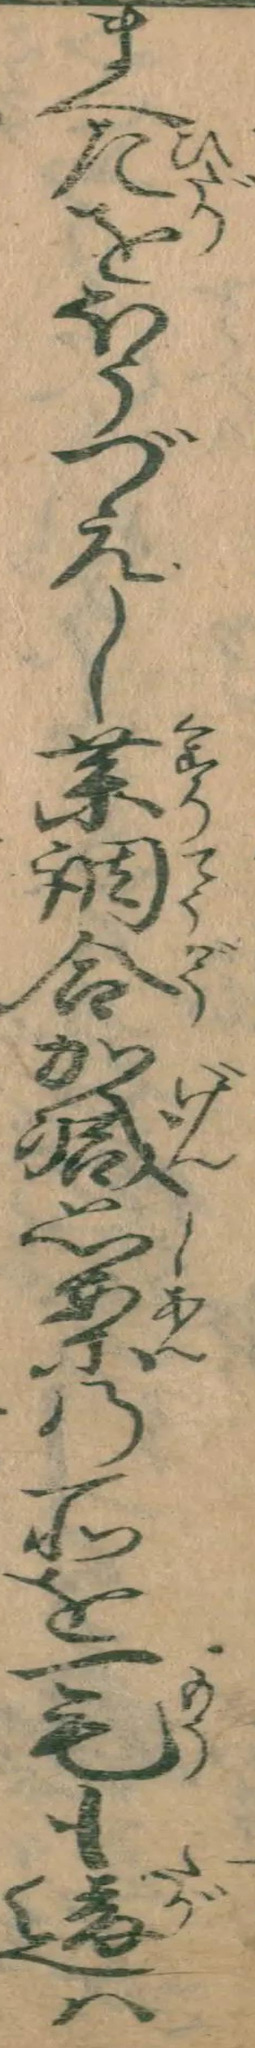まへ左をほうづえし薬調合加減思案の所を一毛も違は
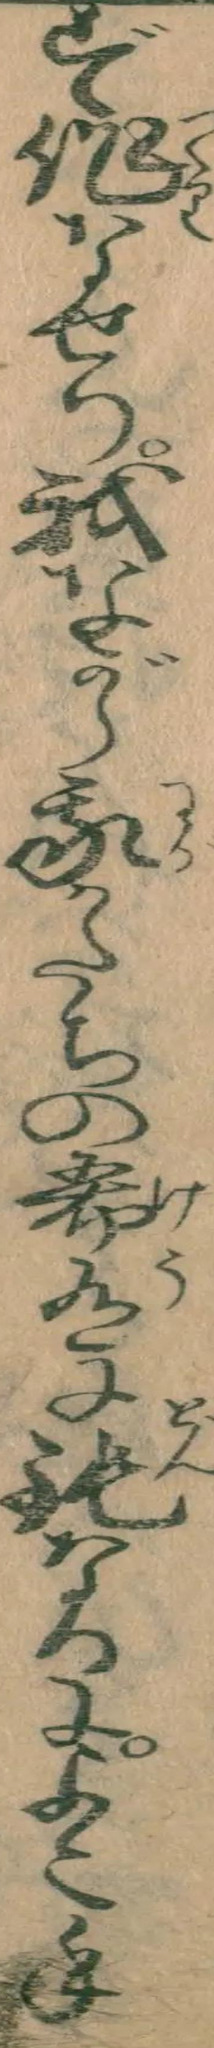ず作なせり。我ながら我かたちの希有に鈍なるに。よこ手
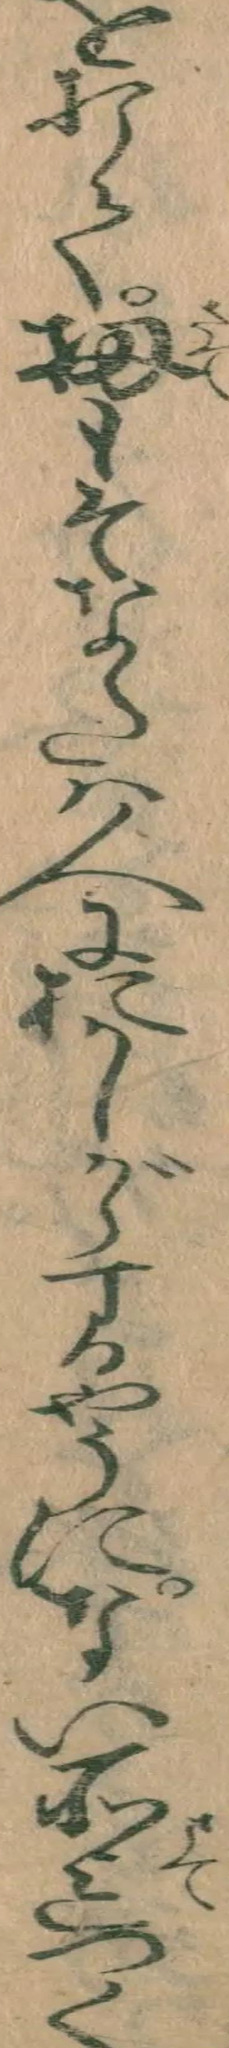を打て。扨もそなたは人におかしがらするやうに。ない所迄つく
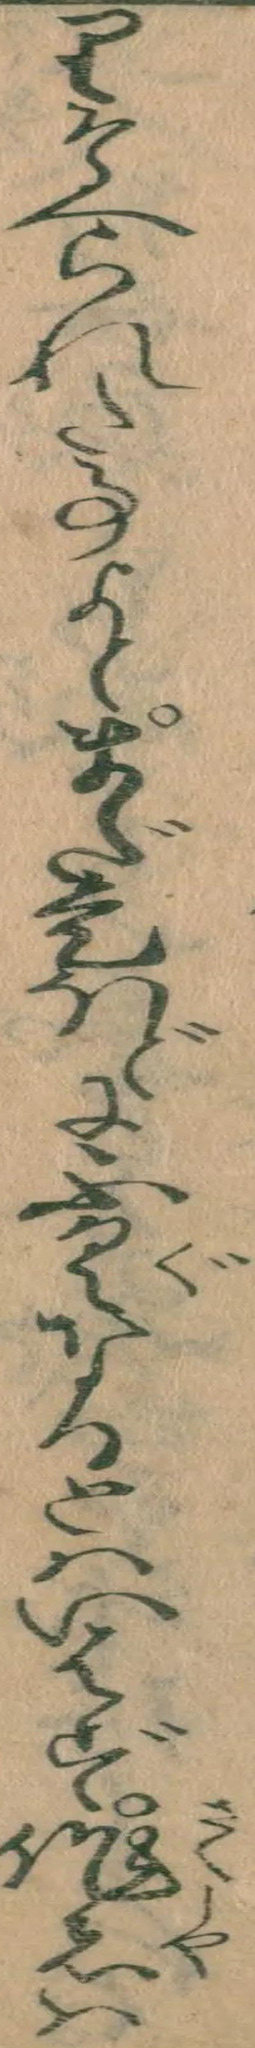りそへられた事よと。まだ是ほどに不具なるとはいはず。作者は
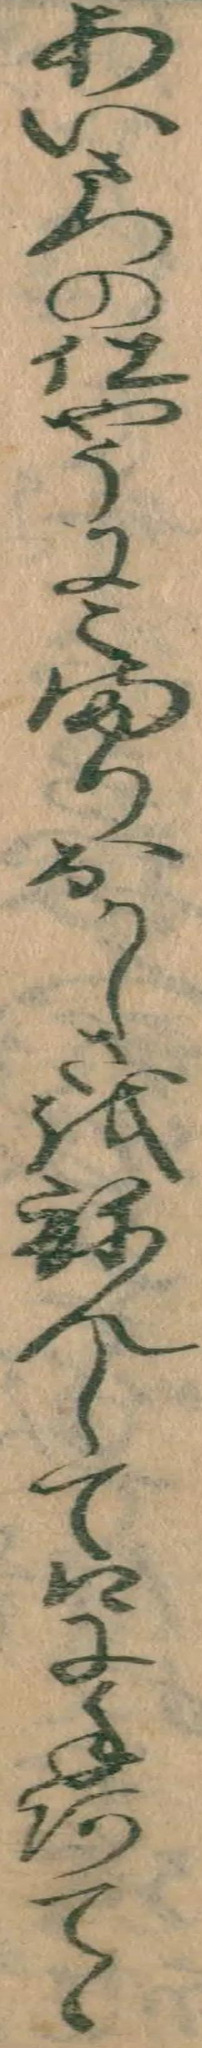あいさつの仕やうにこまりおかしさをねんして口に手あてゝ
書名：新竹斎 5巻
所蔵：国立国会図書館 National Diet Library, JAPAN
